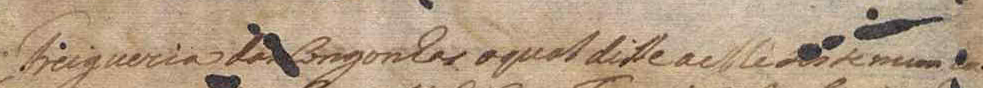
Freiguezia da Congonhas o qual disse a elle testemunha
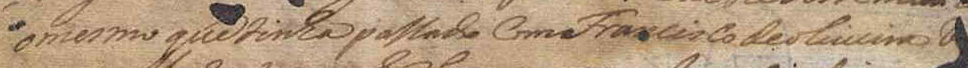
o mesmo que tinha passado com Francisco de oliueira v
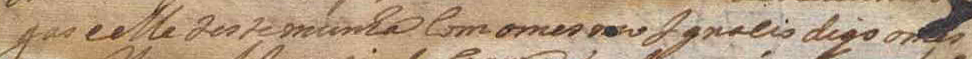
gas e elle testemunha com o mesmo Jgnacio digo o mes
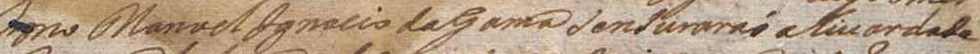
mo Manoel Ignacio da Gama sensuraraõ a liuardade
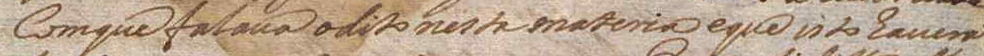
Com que falaua o dito nesta materia e que isto hauera
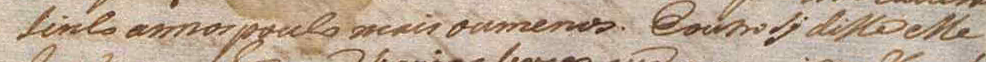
sinCo annos pouCo mais ou menos. E outrosj disse elle
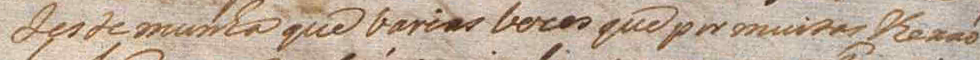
testemunha que varias vezes que por muitas lhe naõ
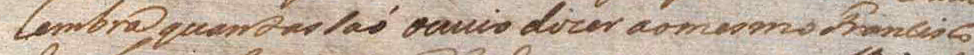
lembra quantas saõ ouuio dizer ao mesmo Francisco
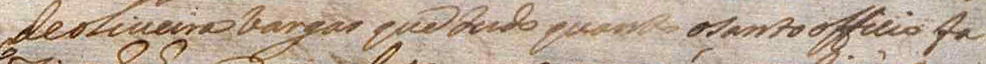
de oliueira vargas que tudo quanto o santo officio fa
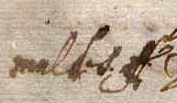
mal d̄ s. off.o
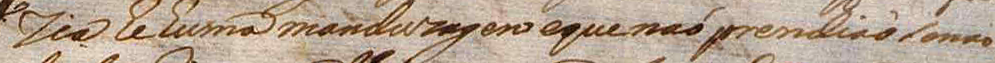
Zia he huma manduzagen e que naõ prendiaõ senao
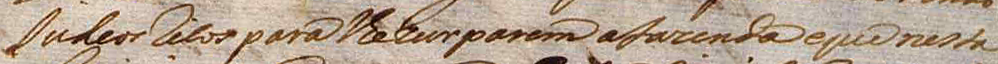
Iudeos Ricos para lhe zurparem a fazenda e que nesta
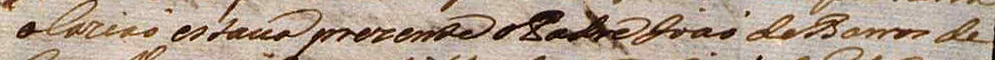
oCaziaõ estaua prezente o Padre Ioaõ de Barros de
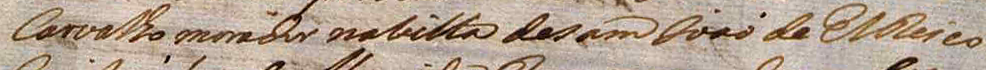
Carvalho morador na villa de sam Ioaõ de El Rei e o
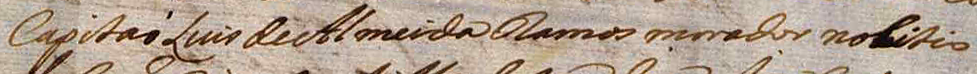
Capitaõ Luis de Almeida Ramos morador no Citio
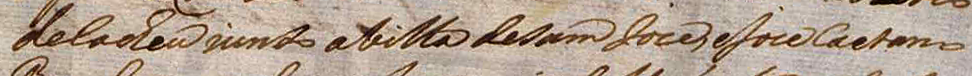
de Cacheu iunto a villa de sam Ioze, e Joze Caetano
